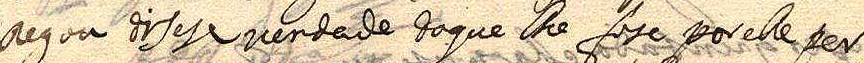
Regou disese verdade do que lhe fose por elle per
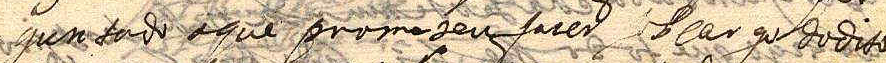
guntado o que prometeu faser sob cargo do dito
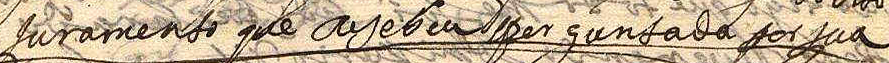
Juramento que Reseveu perguntada por sua
